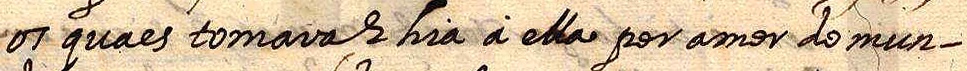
os quaes tomava, E hia a ella por amor do mun
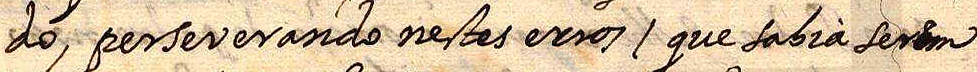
do, perseverando nestes erros / que sabia ser_m
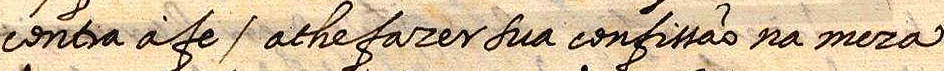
contra a fe / athe fazer sua confissão na meza
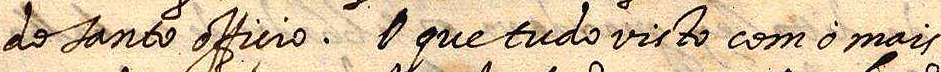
do santo offiçio. O que tudo visto com o mais
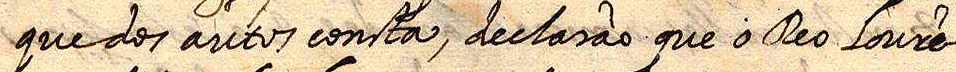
que dos autos consta, declarão que o Reo Lourē
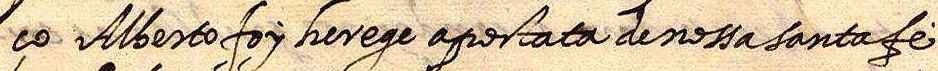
ço Alberto foy herege apostata de nossa santa fe
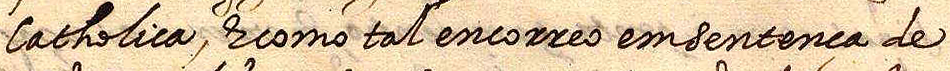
Catholica, E como tal encorreo em sentença de
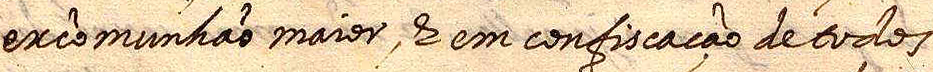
excōmunhão maior, E em confiscação de todos
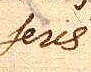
seus
